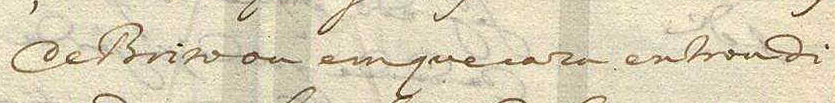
de Brito ou em que caza entrou di
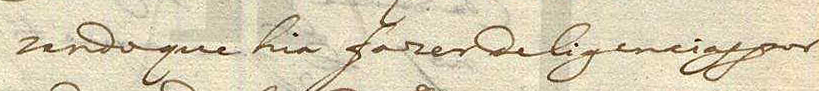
zendo que hia fazer deligencias por
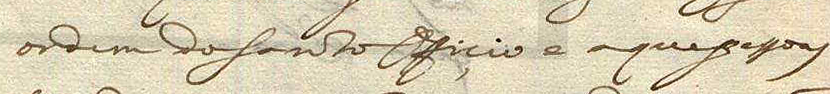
ordem do santo Officio e a que pessoas
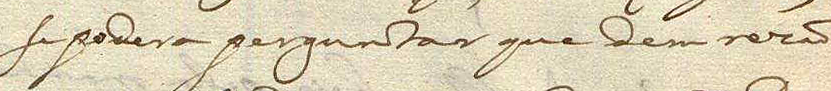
se podera perguntar que dem rezaõ
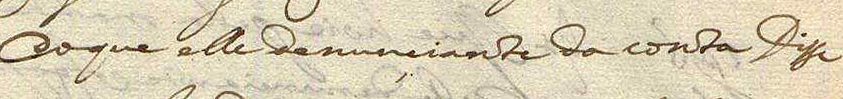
do que elle denunciante da conta Disse
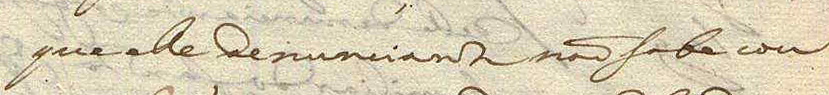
que elle denunciante naõ sabe cou
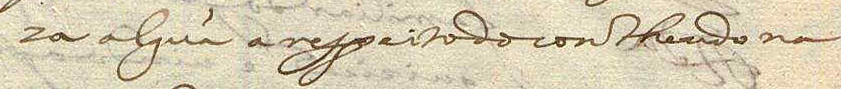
za alguā a respeito do contheudo na
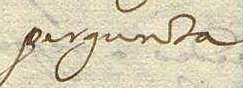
pergunta
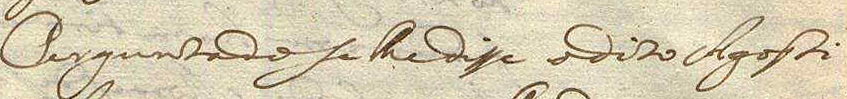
Perguntado se lhe disse o dito Agosti
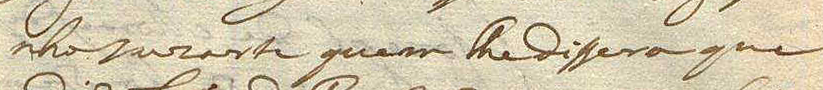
nho Zuzarte quem lhe dissera que
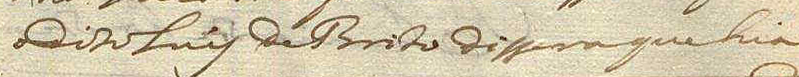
o dito Luis de Brito dissera que hia
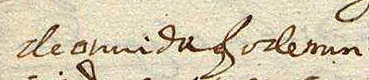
de ouuida q̄ o denun
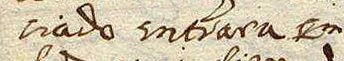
ciado Entrara em
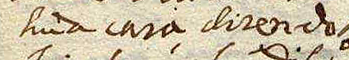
hūa caza, dizendo
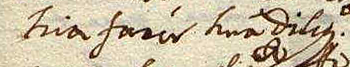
hia fazer huā dilig.a
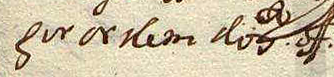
por ordem do s.to off.o
